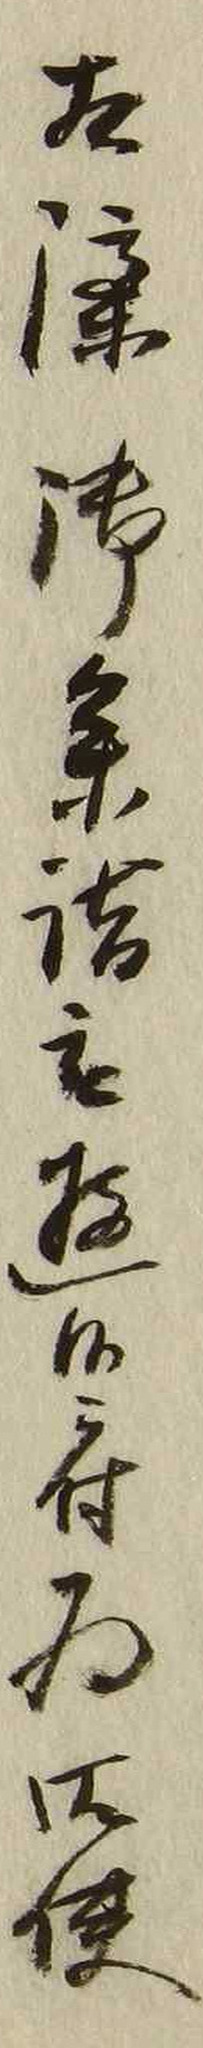相済御参詣被遊候ニ付為御使
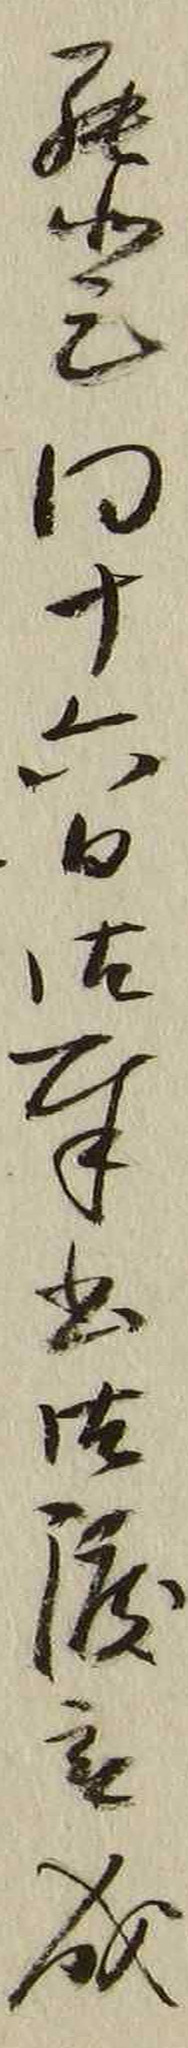罷登同十六日御奉書御渡被成
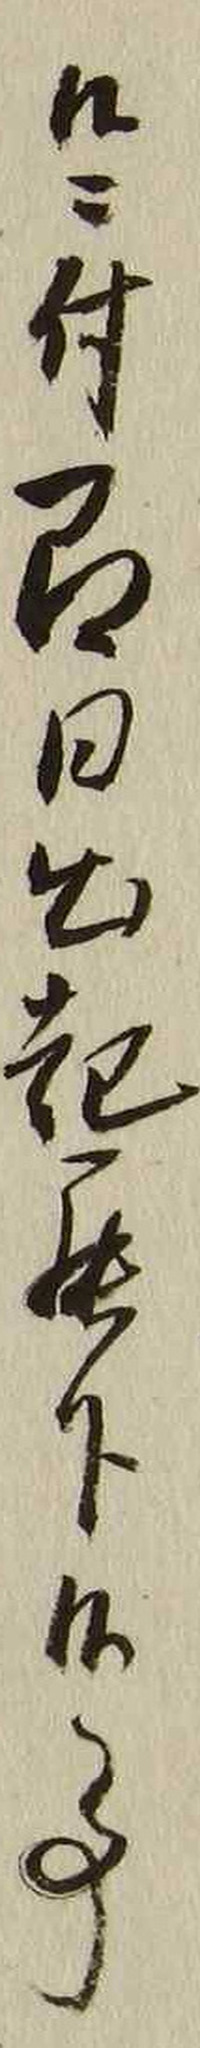候ニ付即日出起罷下候事
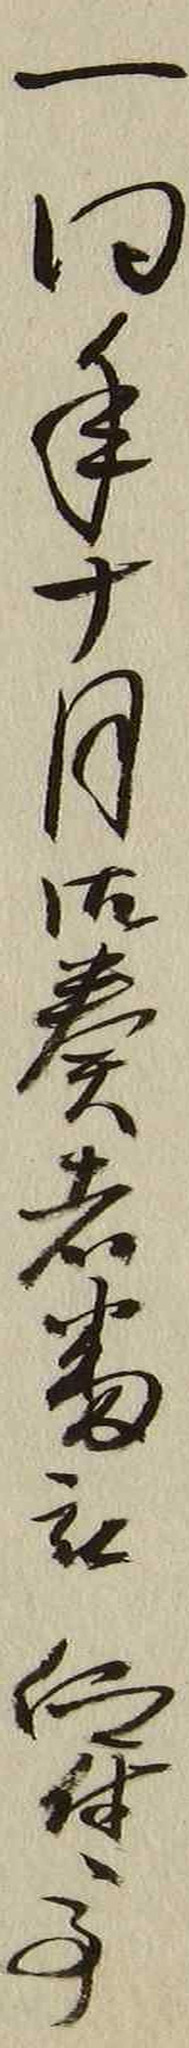一同年十月御奏者番被仰付候事
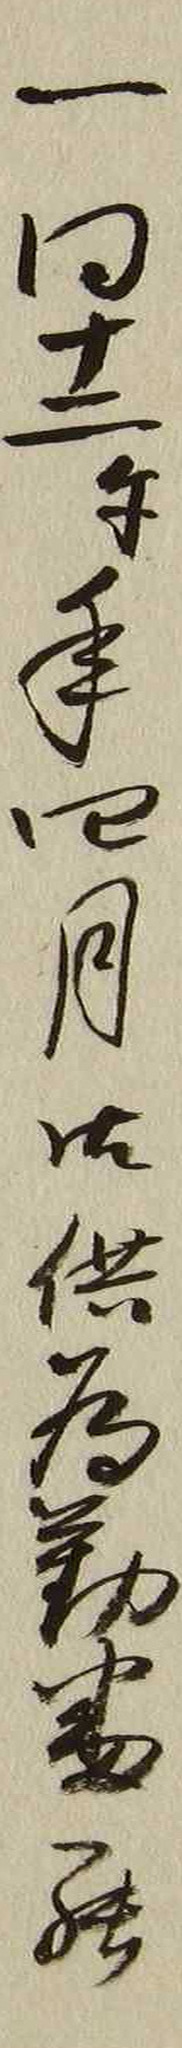一同十二午年四月御供為勤番罷
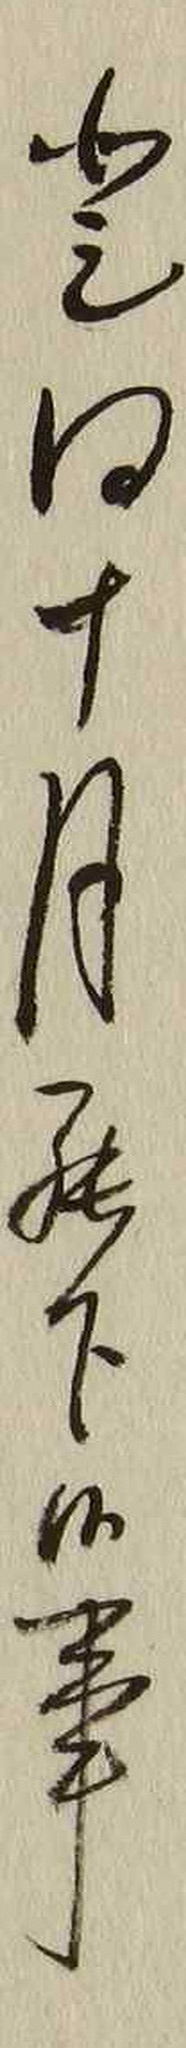登同十月罷下候事
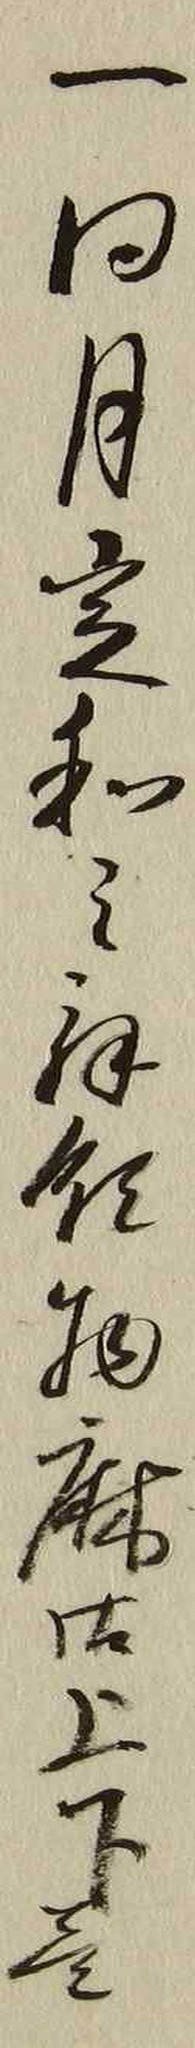一同月定和之拝領物麻御上下壱
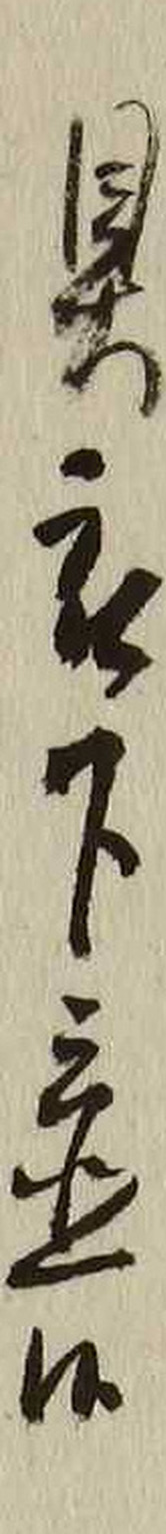具被下置候
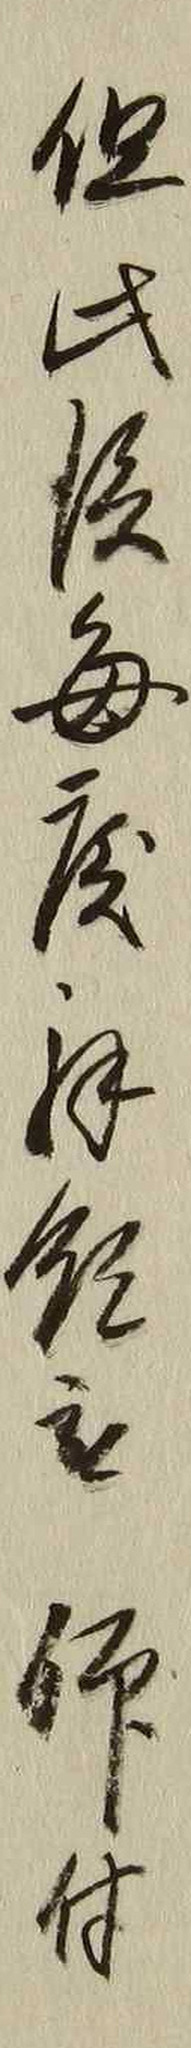但此後毎度拝領被仰付
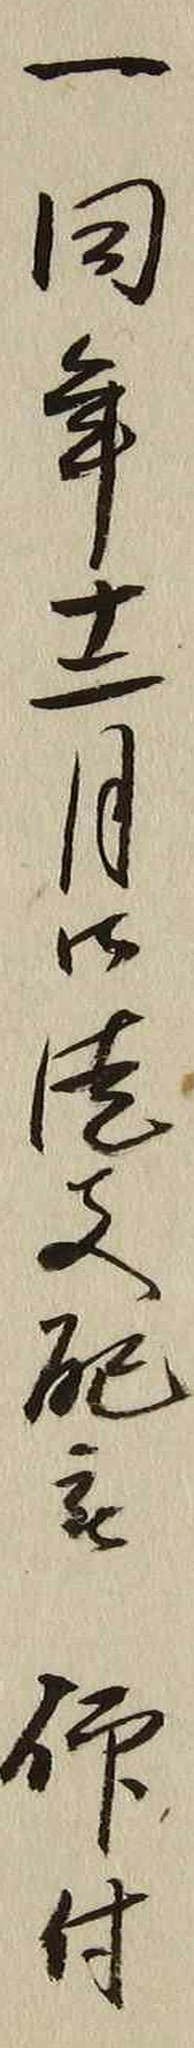一同年十二月御徒支配被仰付
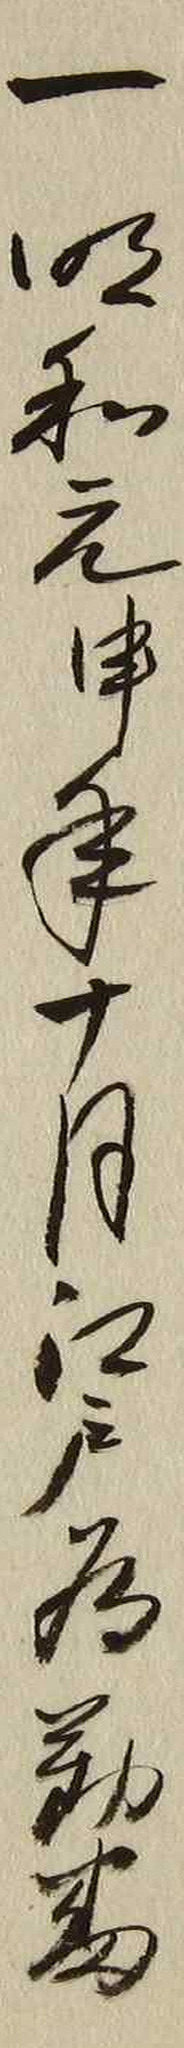一明和元申年十月江戸為勤番
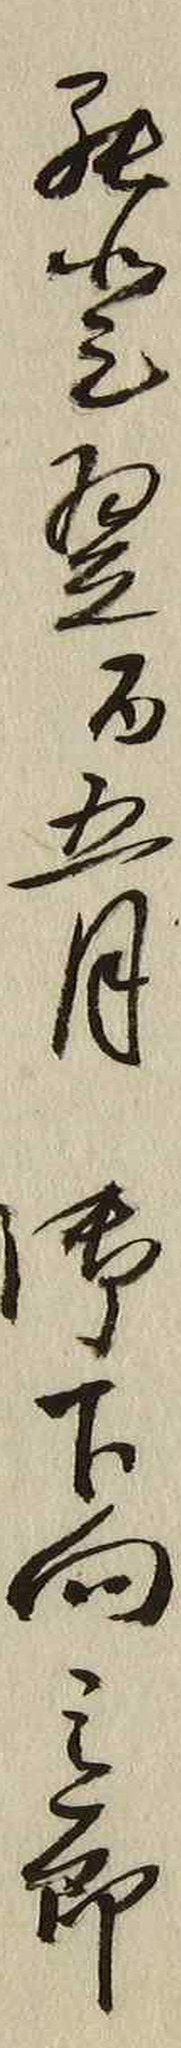罷登翌酉五月御下向之節
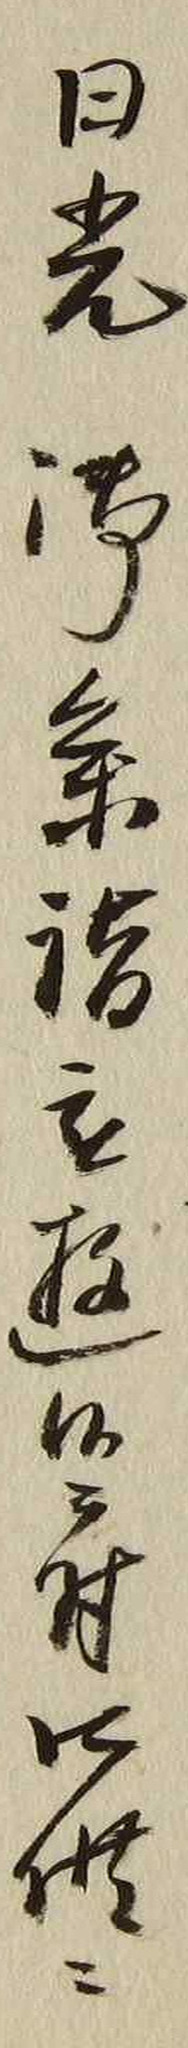日光御参詣被遊候ニ付御供ニ
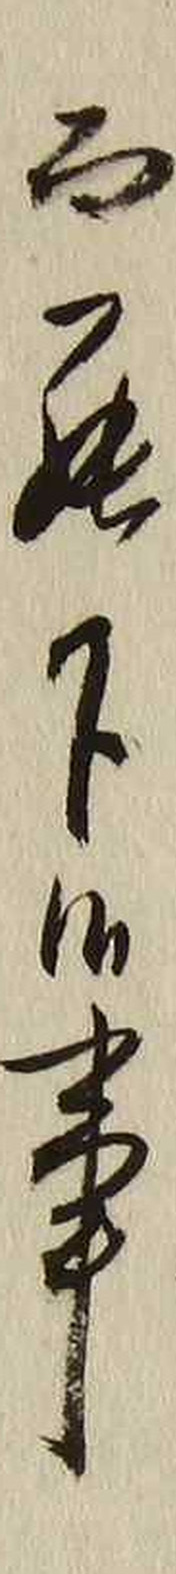而罷下候事
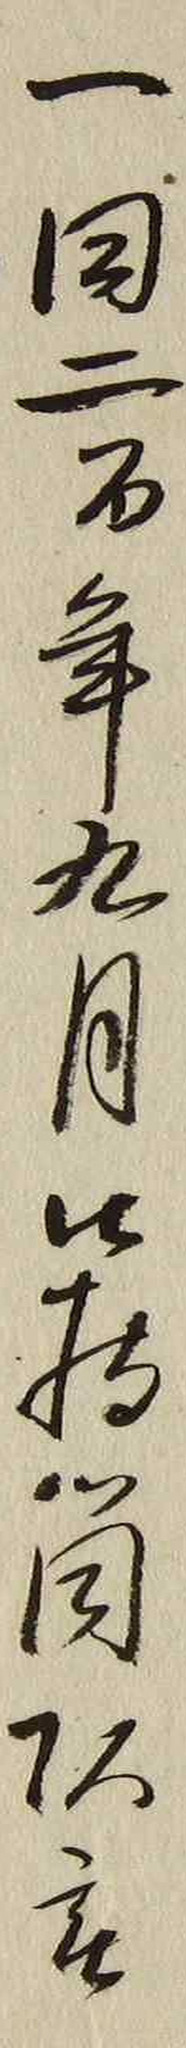一同二酉年九月御持筒頭被
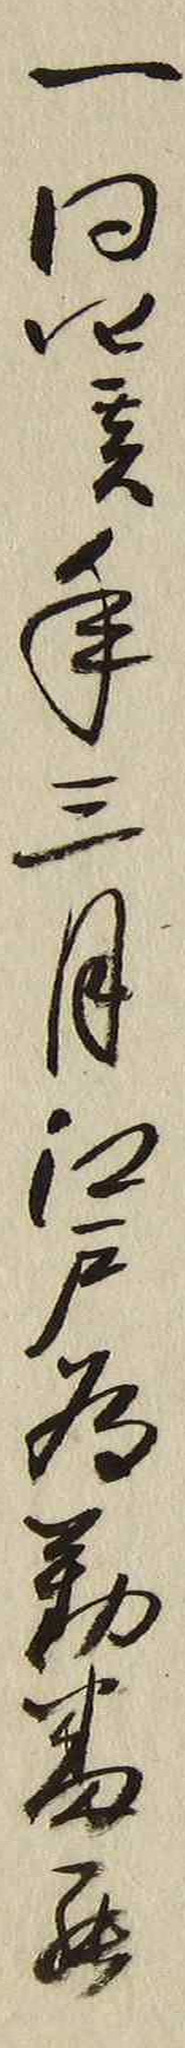一同四亥年三月江戸為勤番罷
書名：諸士系譜　巻之356　す之部6
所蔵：会津若松市立会津図書館
